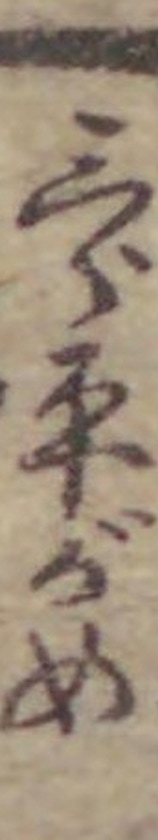三郎平がめ
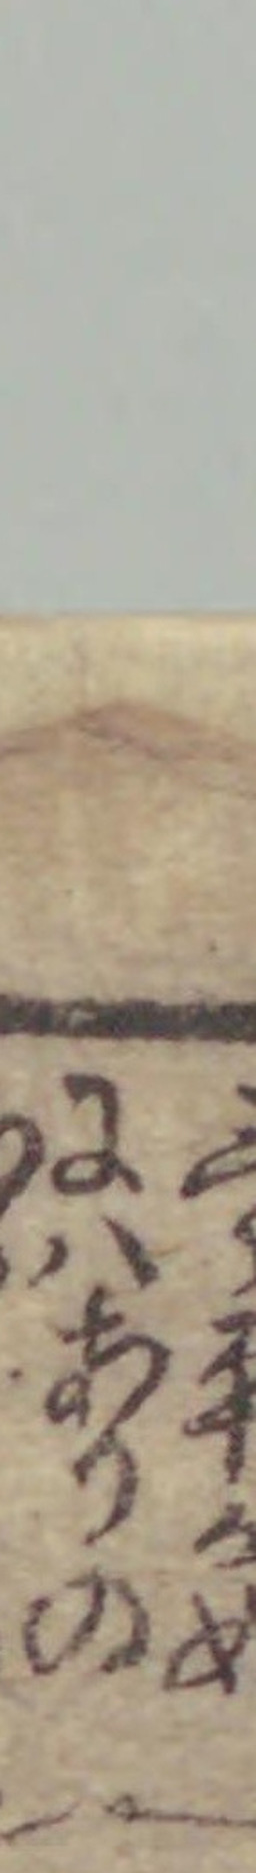にはありの
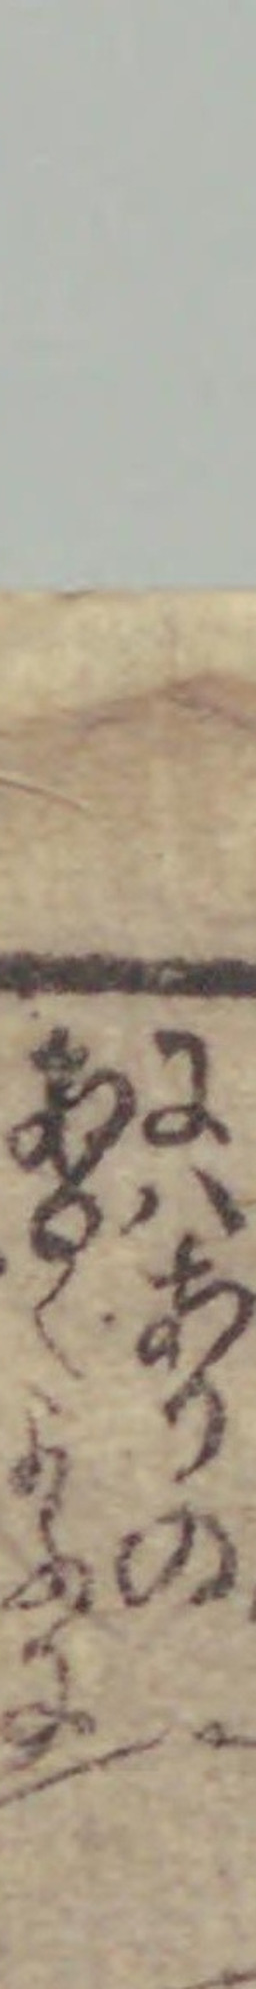あるくよふに
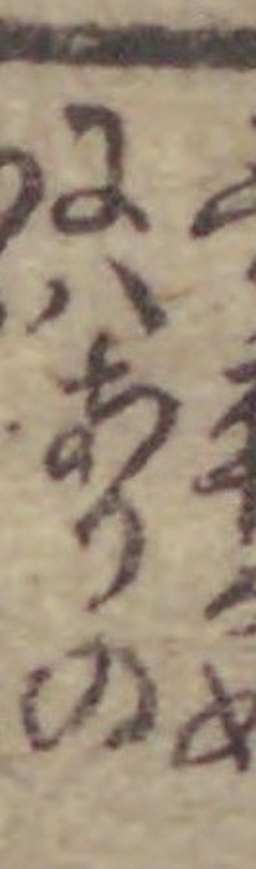にはありの
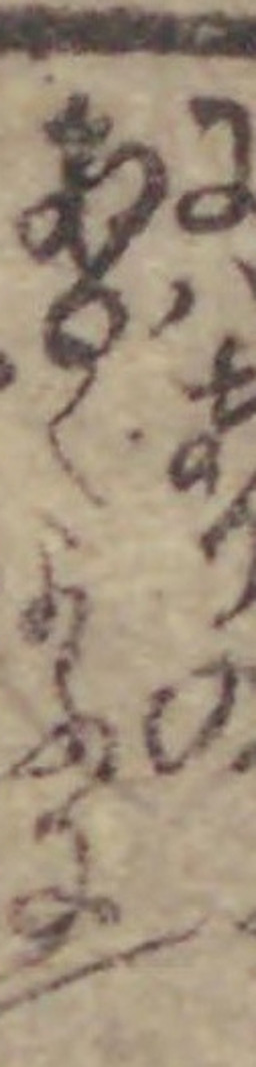あるくよふに
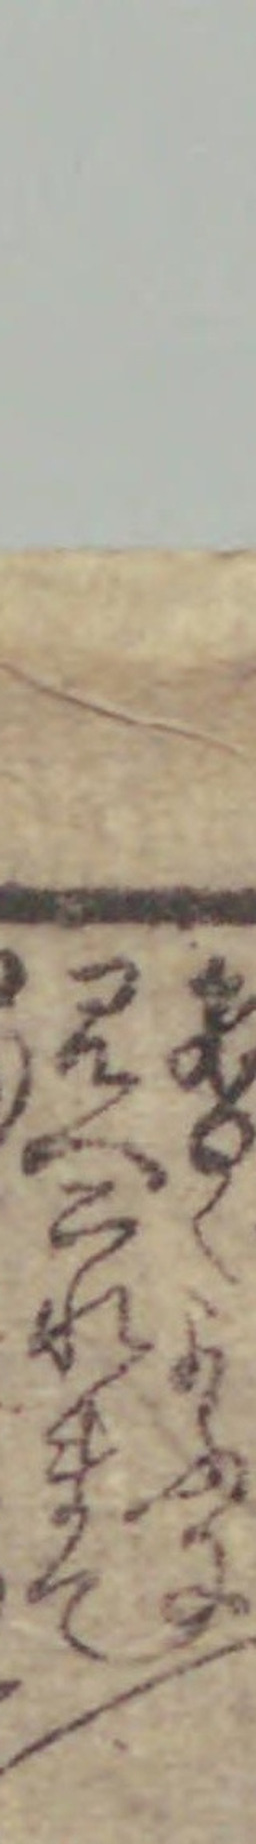見へこれまて
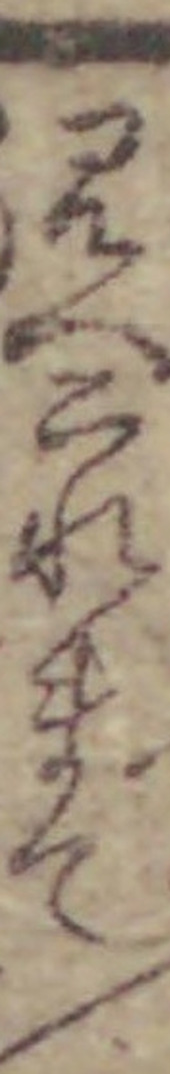見へこれまて
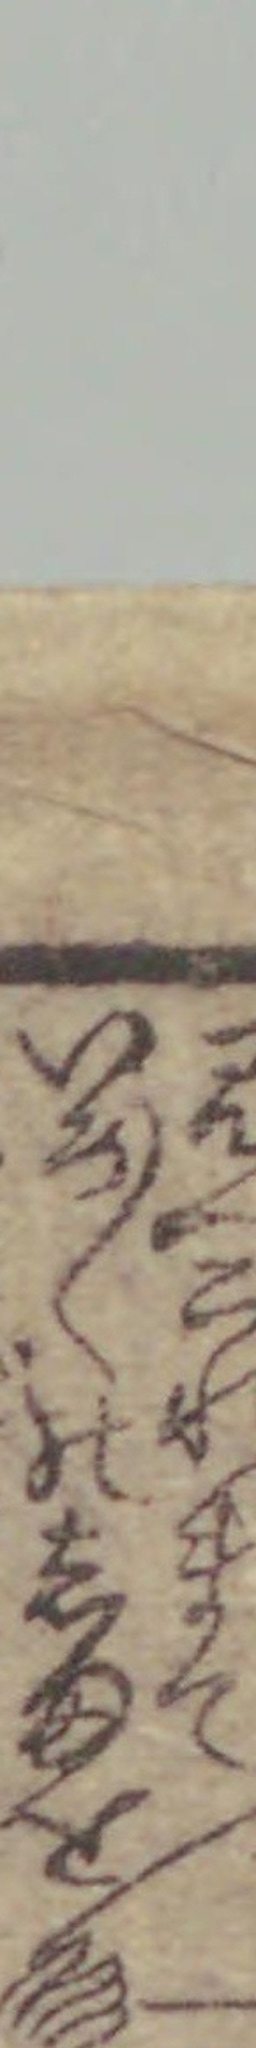いろ〳〵のしまを
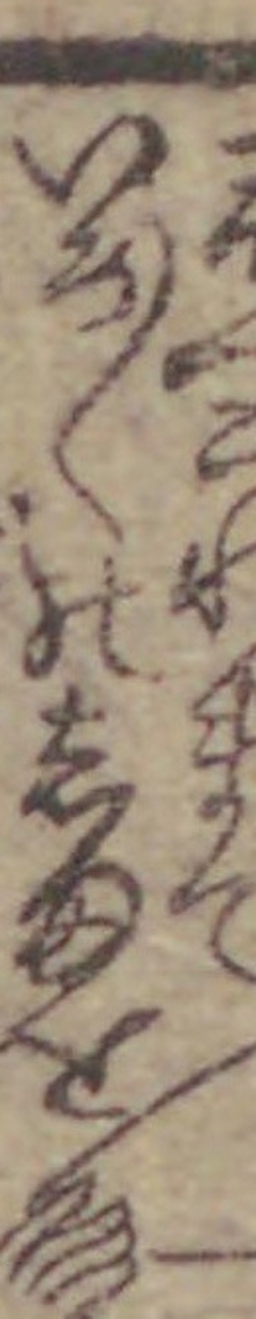いろ〳〵のしまを
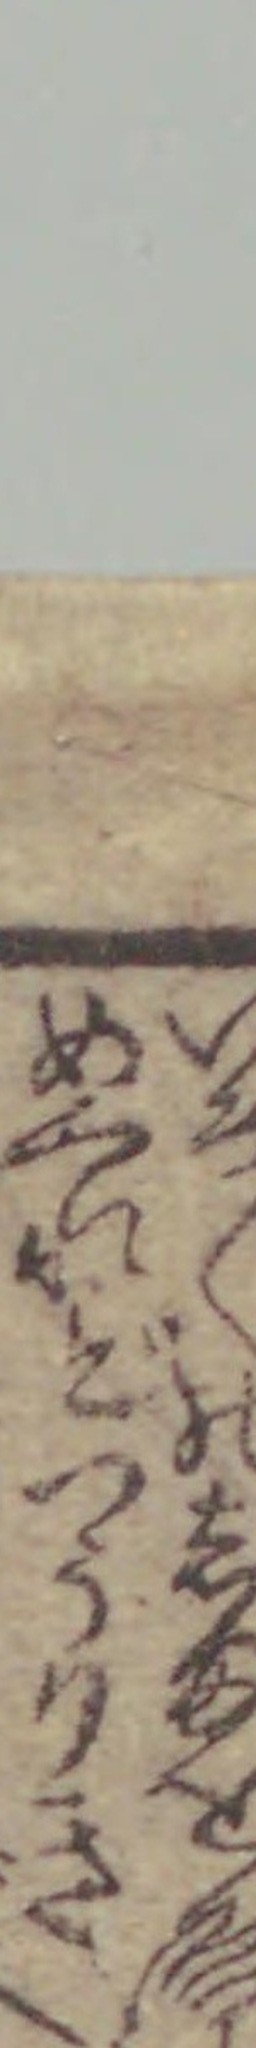めくれどつうりき
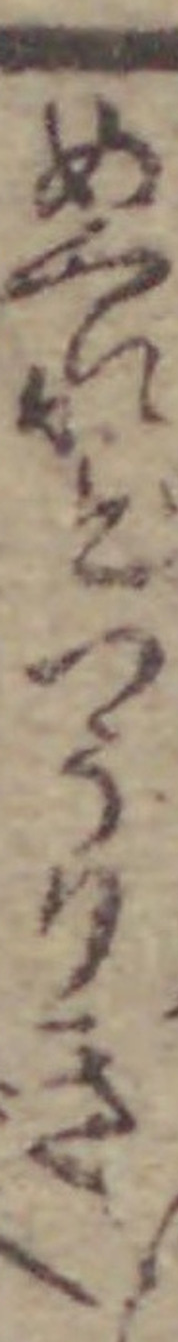めくれどつうりき
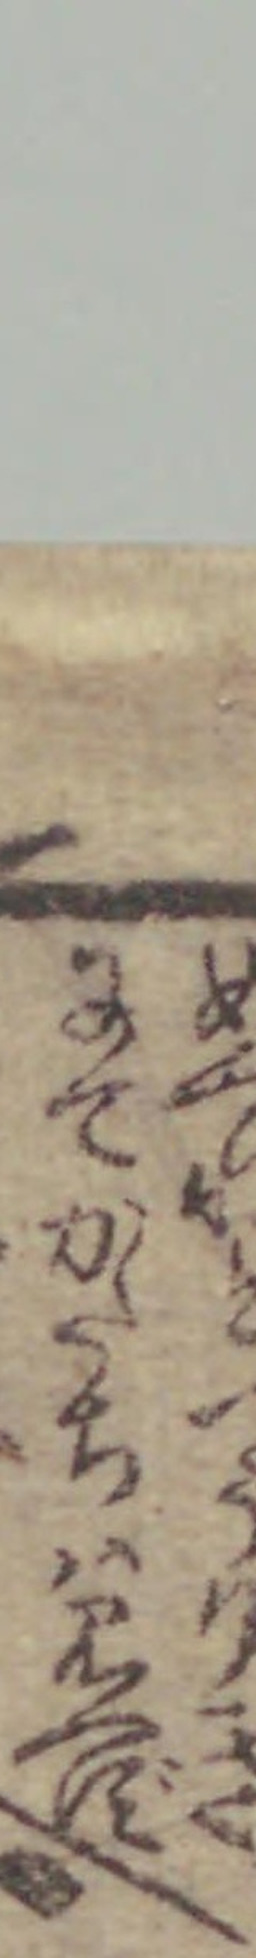にてかたちは見へず
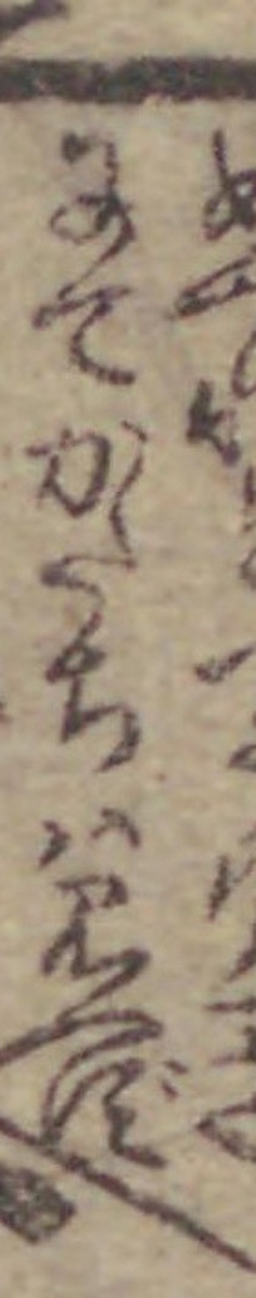にてかたちは見へず
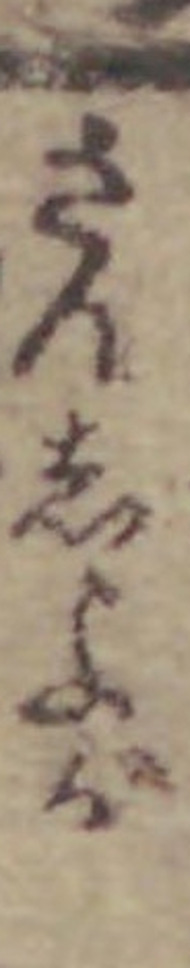さんしよが
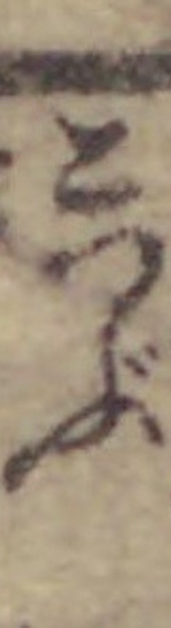こつぶ
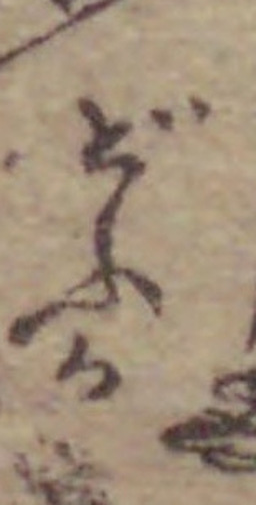どふか
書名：近頃嶋めぐり 3巻
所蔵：国立国会図書館 National Diet Library, JAPAN
